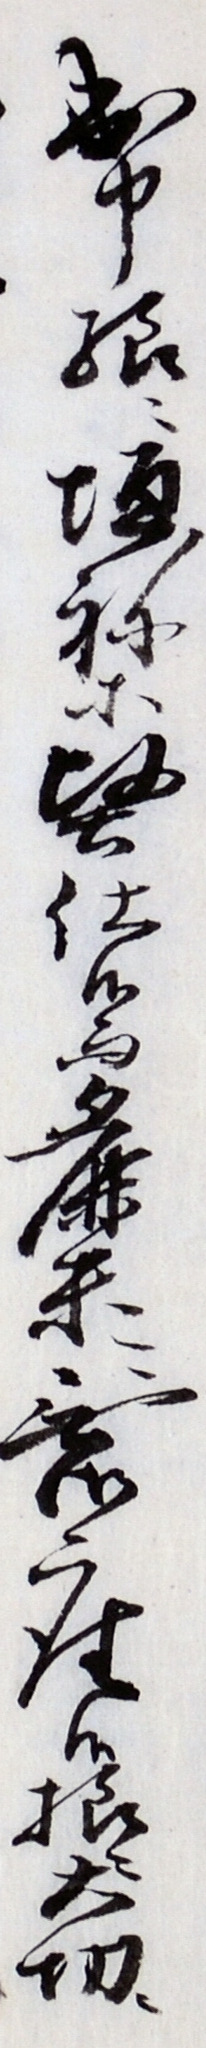出申様ニ垣ね等堅仕候而麁末ニ無御座候様ニ大切ニ
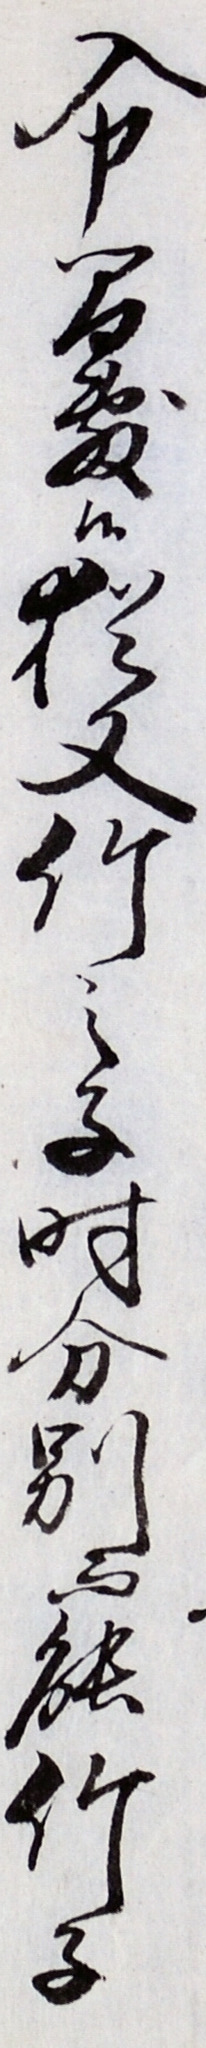入申間敷候猶又竹之子時分別而能竹子
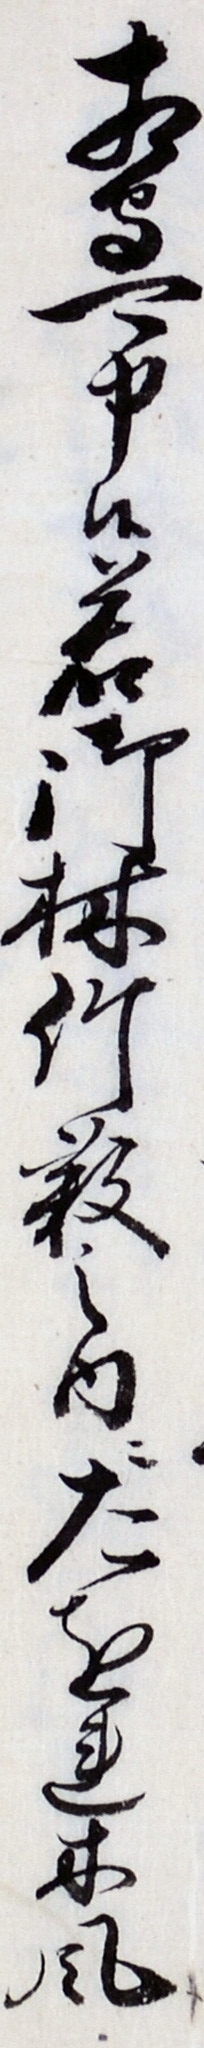相守可申候若御林竹薮之内ニたをれ木風
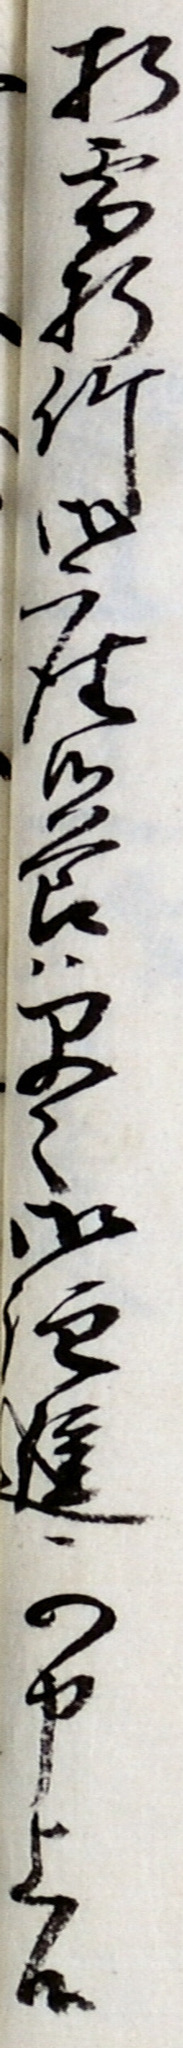折雪折竹御座候節ハ早々御注進可申上候
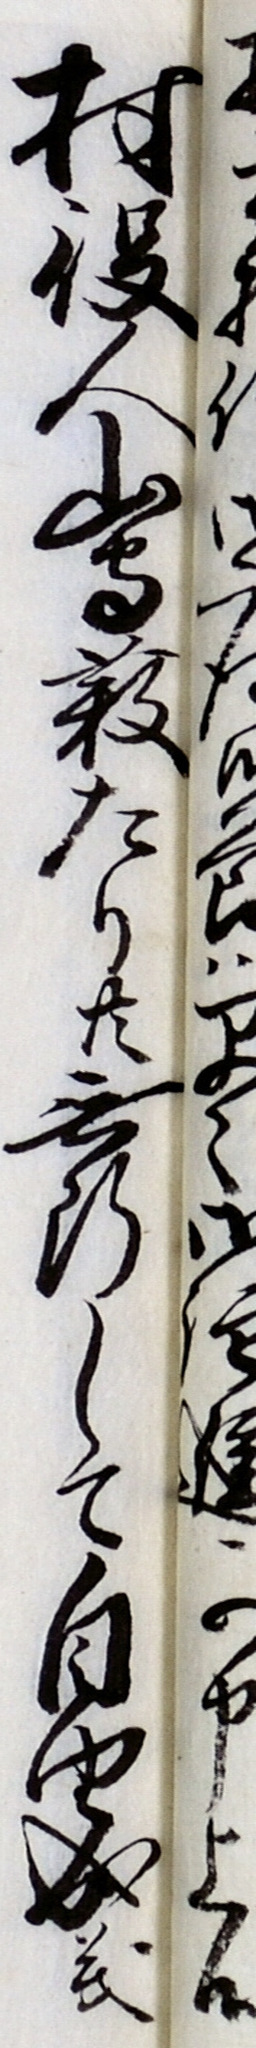村役人山守薮たり共無断して自由成も
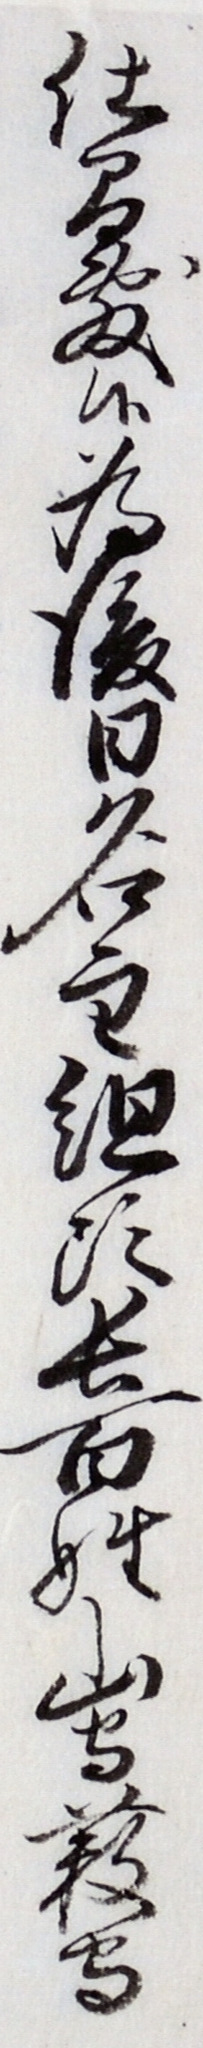仕間敷候為後日名主組頭長百姓山守薮守
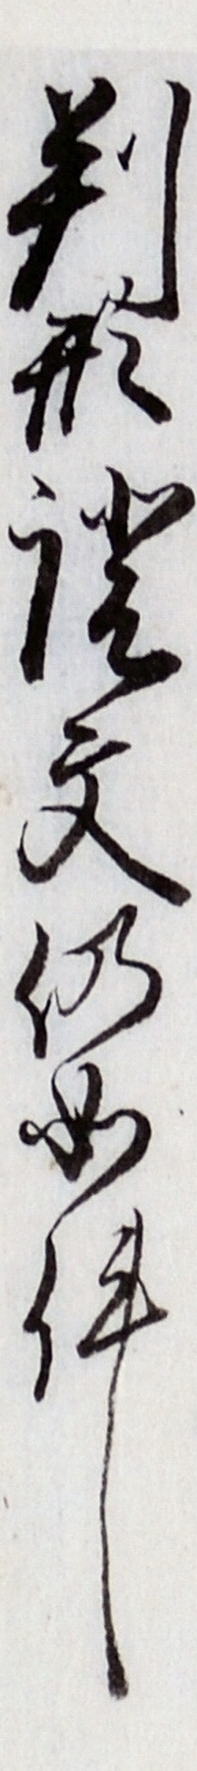判形証文仍如件
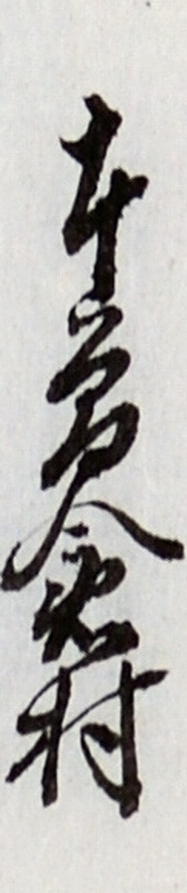本曽倉村
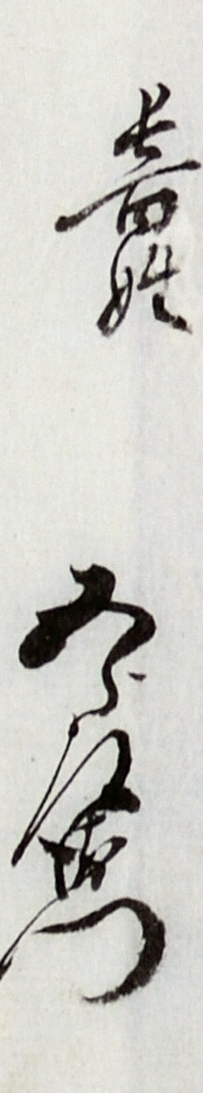長百姓五郎左衛門
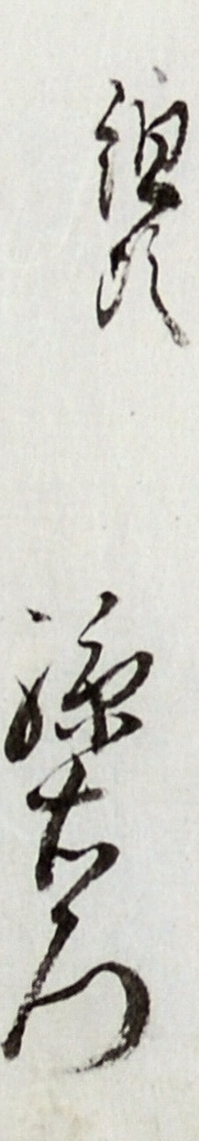組頭孫右衛門

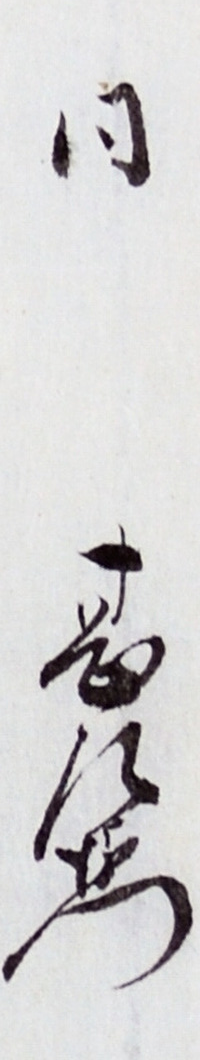同甚左衛門
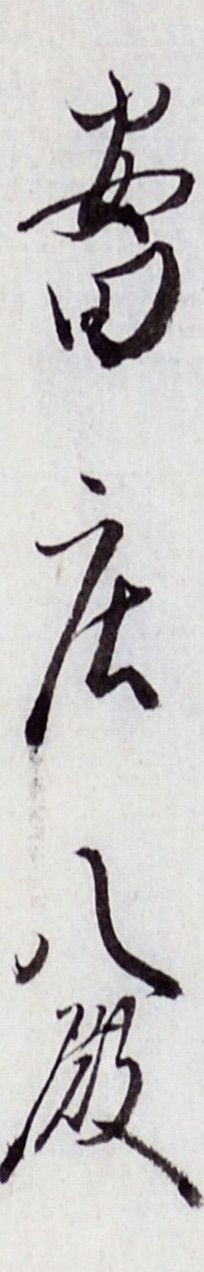安田庄八殿
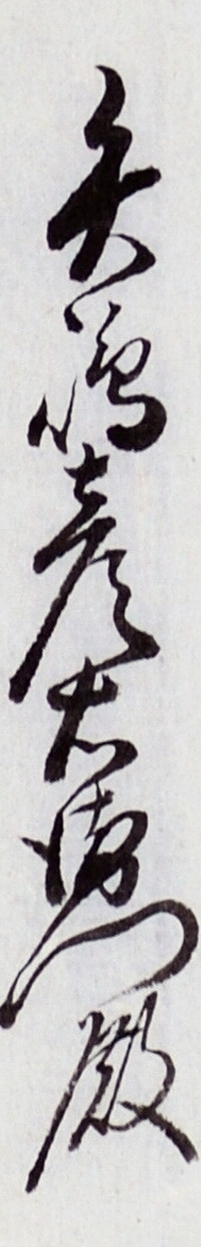矢嶋彦右衛門様
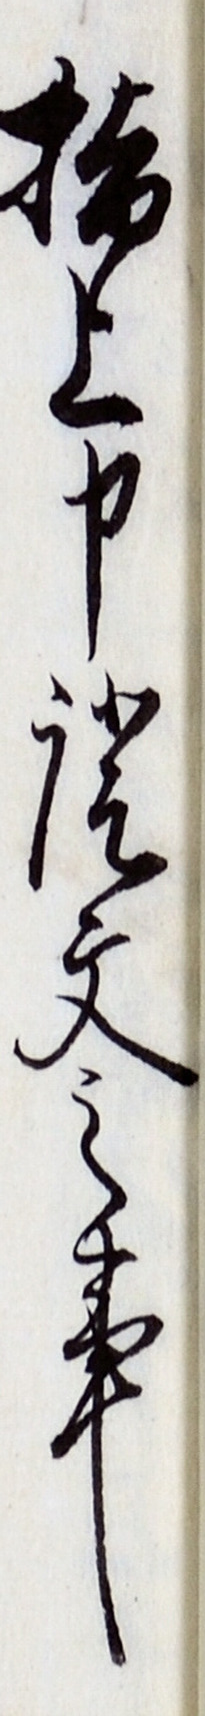指上申証文之事
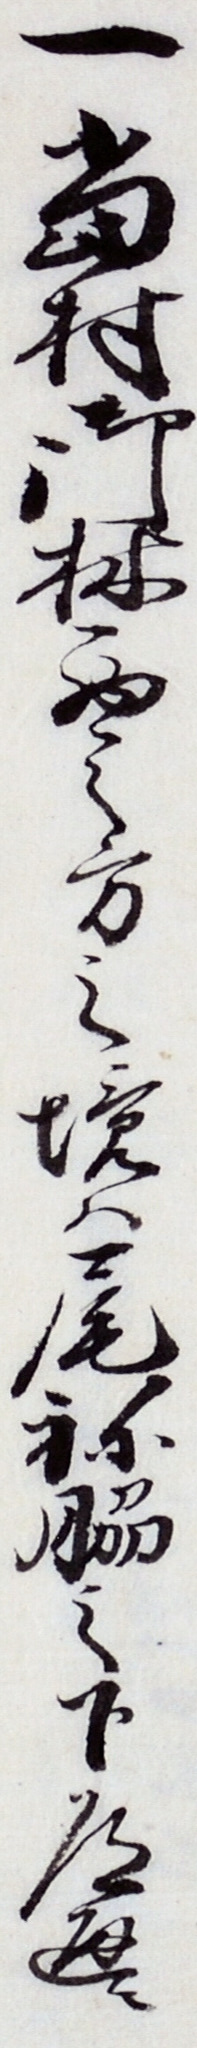一当村御林西之方之境ハ尾ね脇之下道通ニ
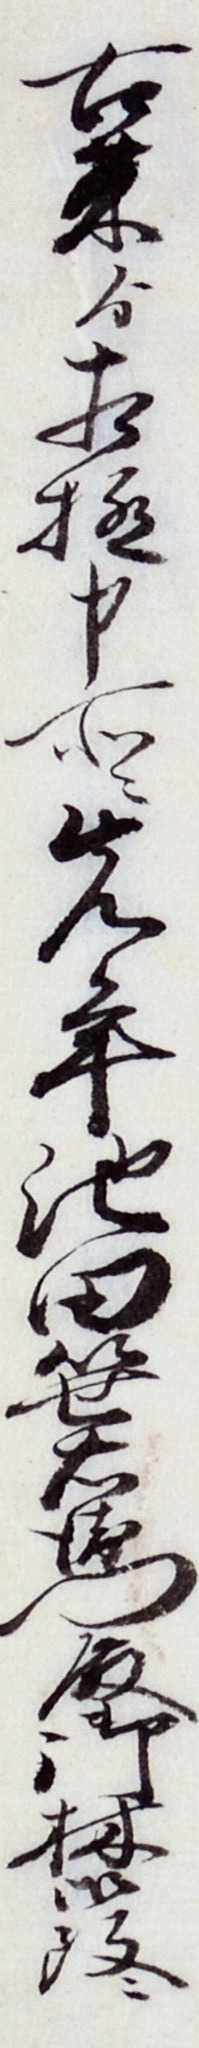古来ゟ相極申所ニ先年池田笹右衛門殿御林御改ニ
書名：御林御竹藪証文控
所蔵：伊那市立高遠町図書館・合同会社AMANE
